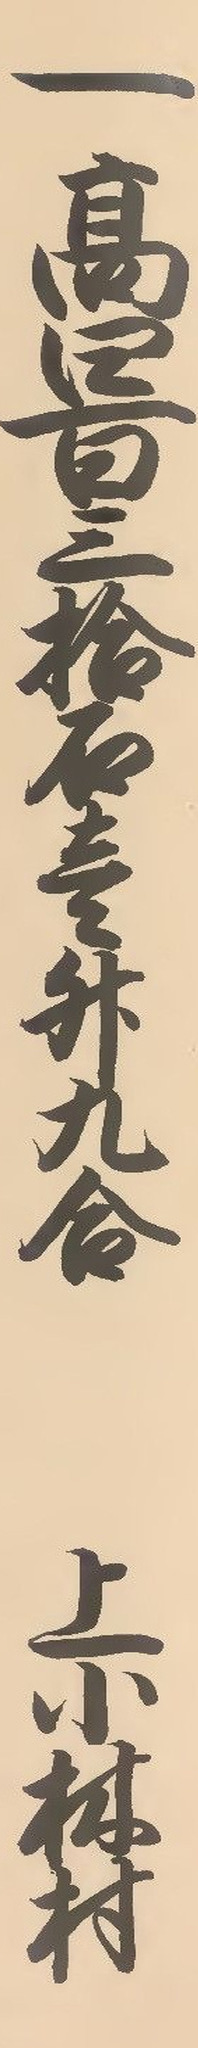一髙四百三拾石壱升九合上小林村
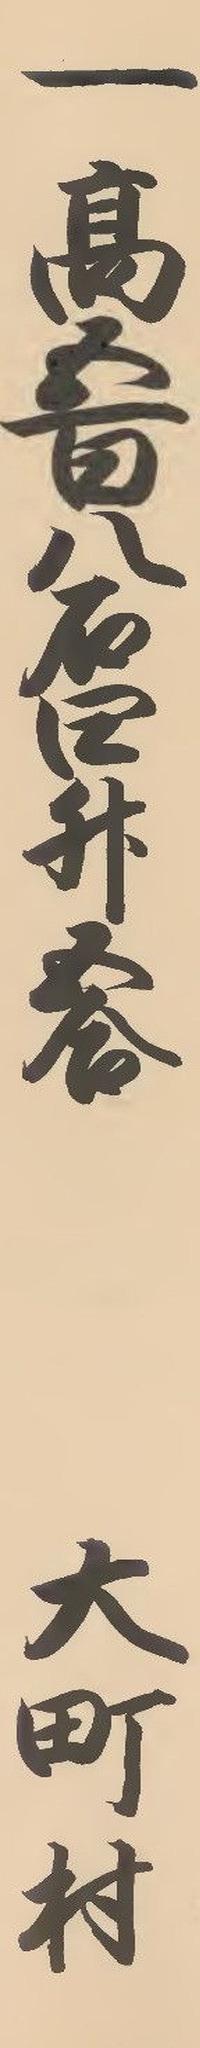一髙五百八石四升五合大町村
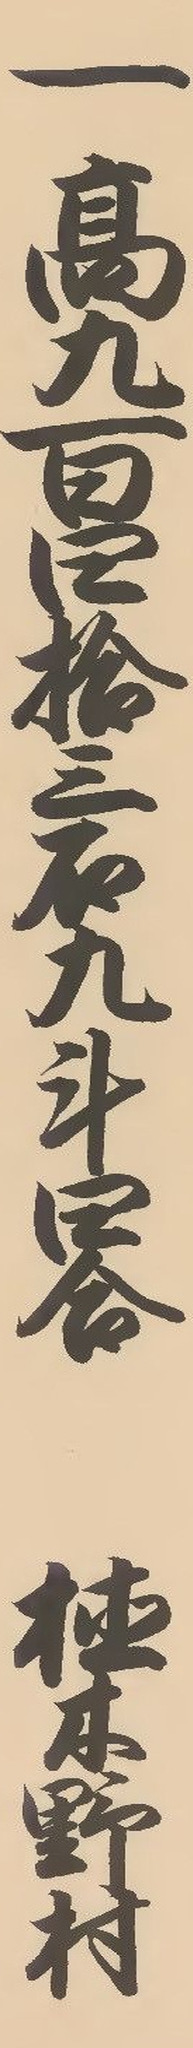一髙九百四拾三石九斗四合植木野村
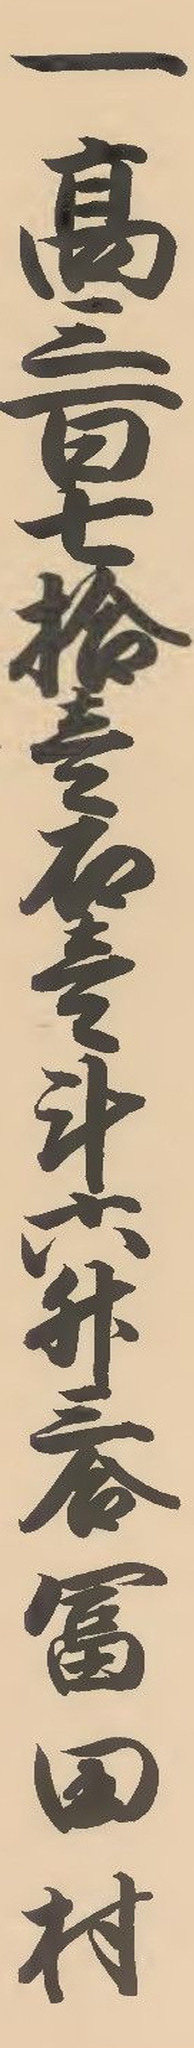一髙三百七拾壱石壱斗六升三合冨田村

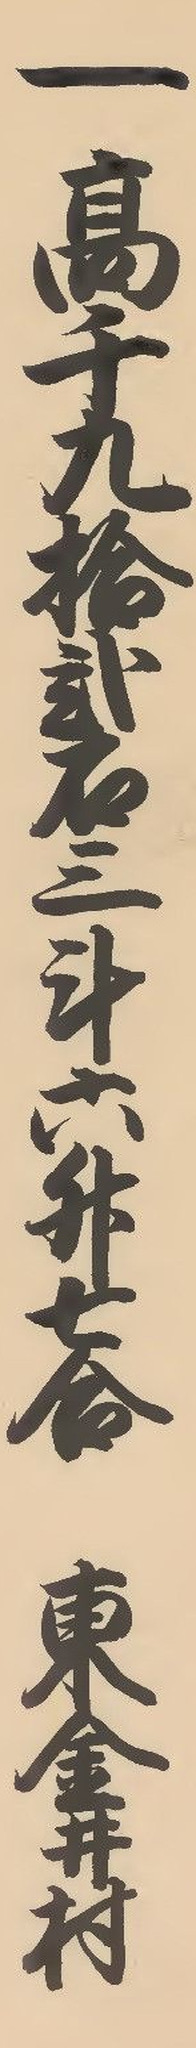一髙千九拾弐石三斗六升七合東金井村
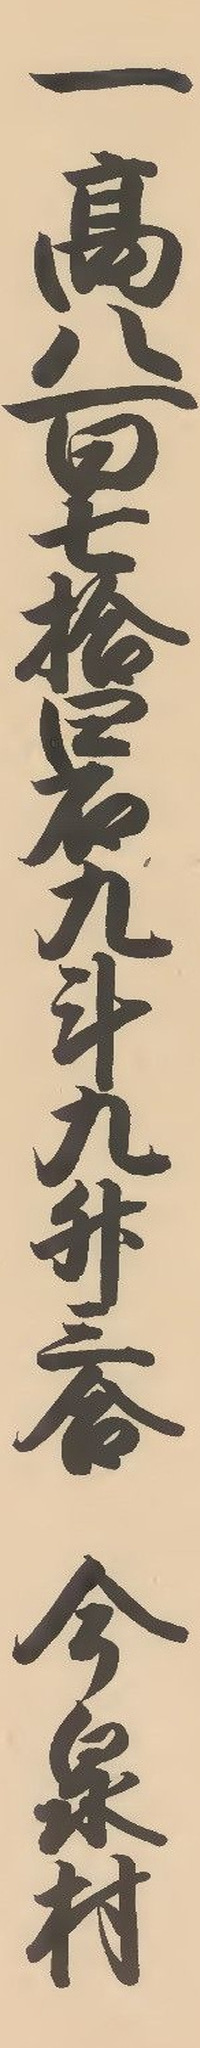一髙八百七拾四石九斗九升三合今泉村
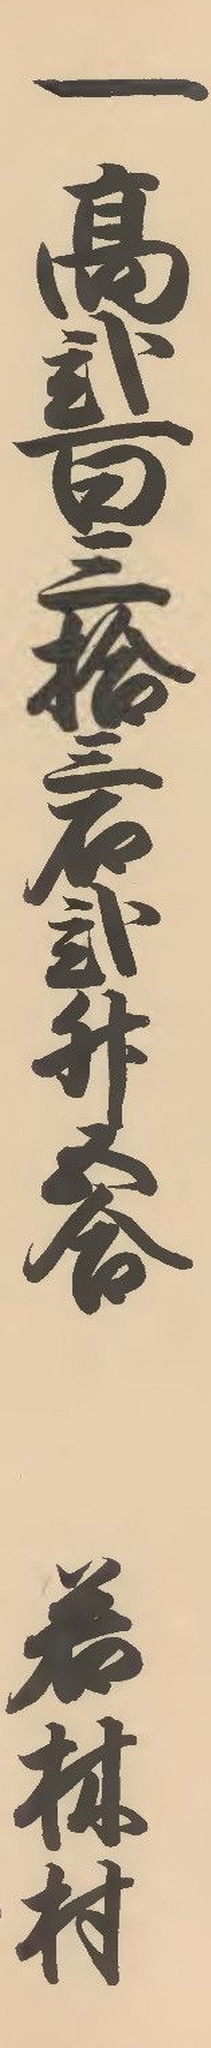一髙弐百三拾三石弐升五合若林村
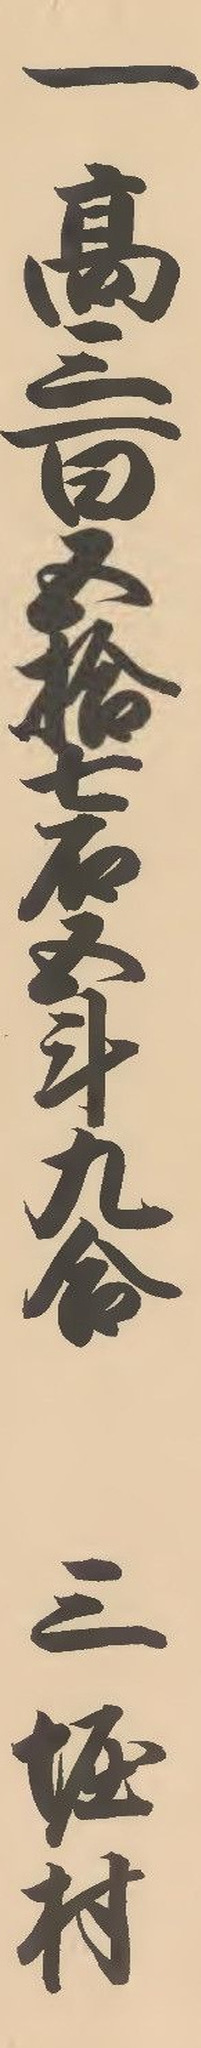一髙三百五拾七石五斗九合三堀村
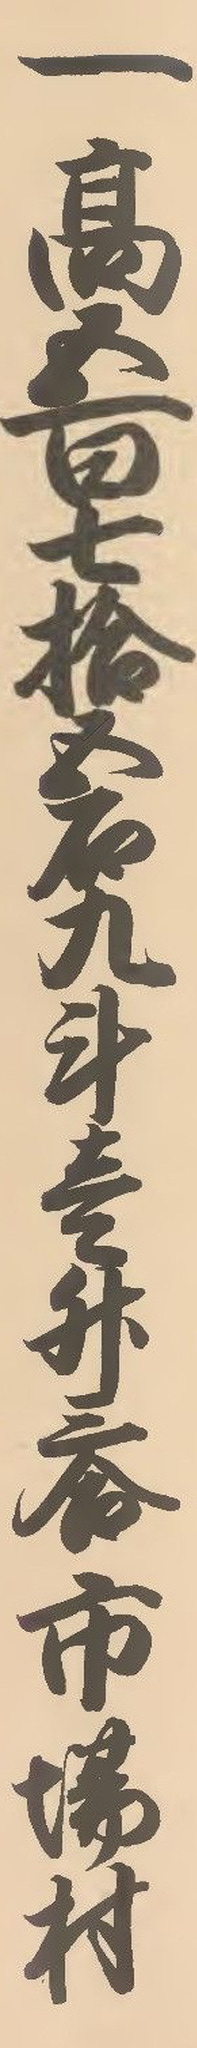一髙五百七拾五石九斗壱升三合市場村
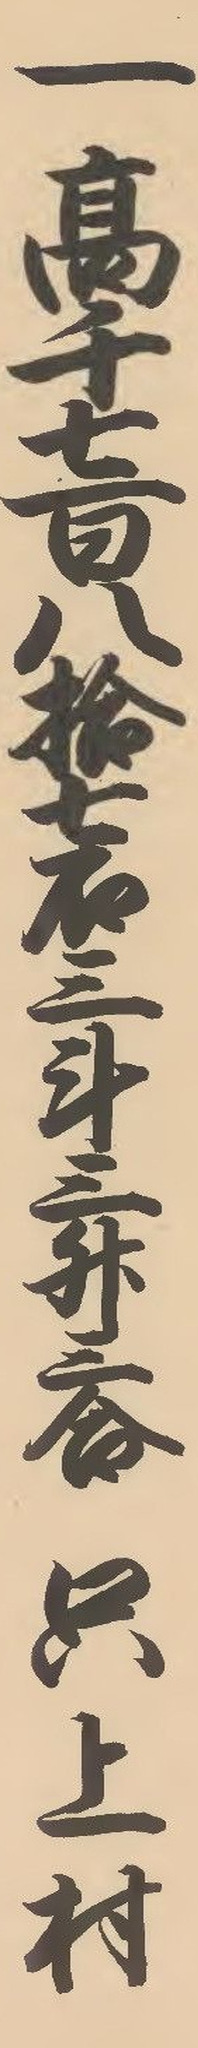一髙千七百八拾七石三斗三升三合只上村
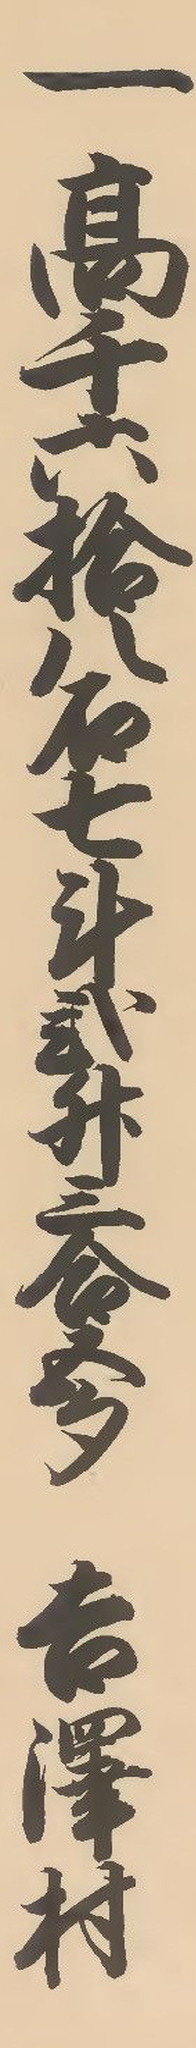一髙千六拾八石七斗弐升三合五夕吉澤村

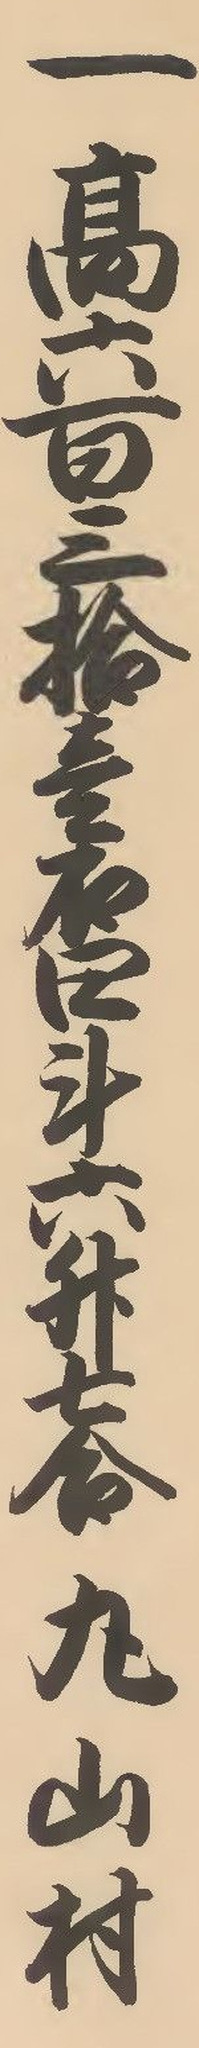一髙六百三拾壱石四斗六升七合丸山村
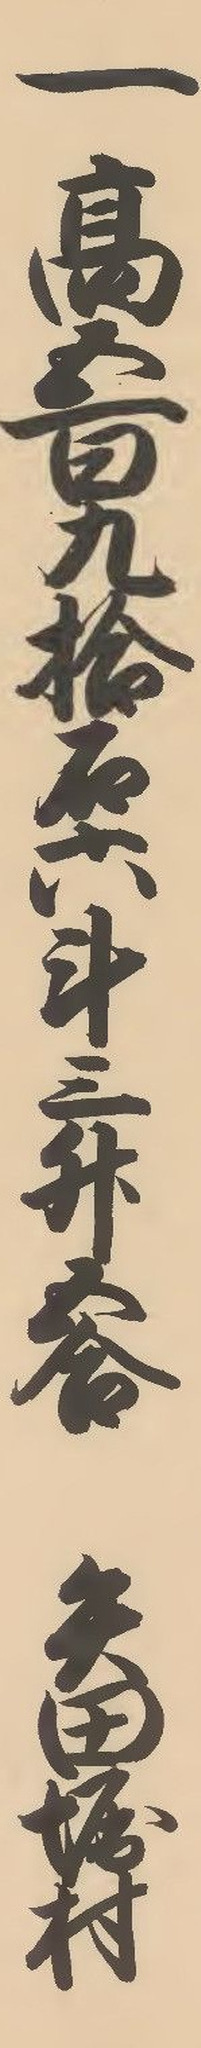一髙五百九拾石六斗三升五合矢田堀村
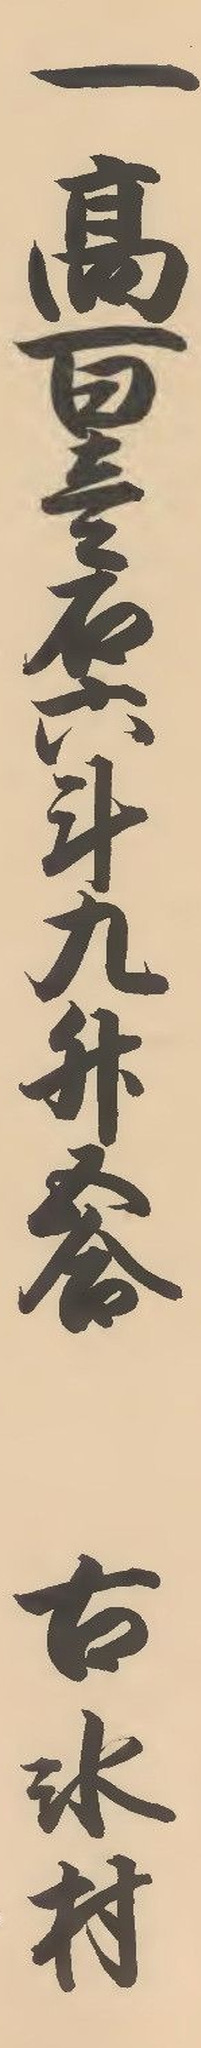一髙百壱石六斗九升五合古水村
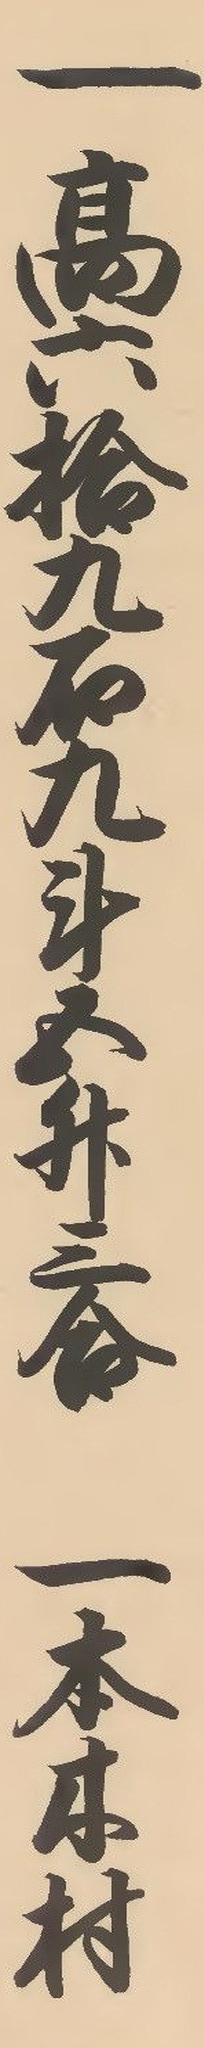一髙六拾九石九斗五升三合一本木村
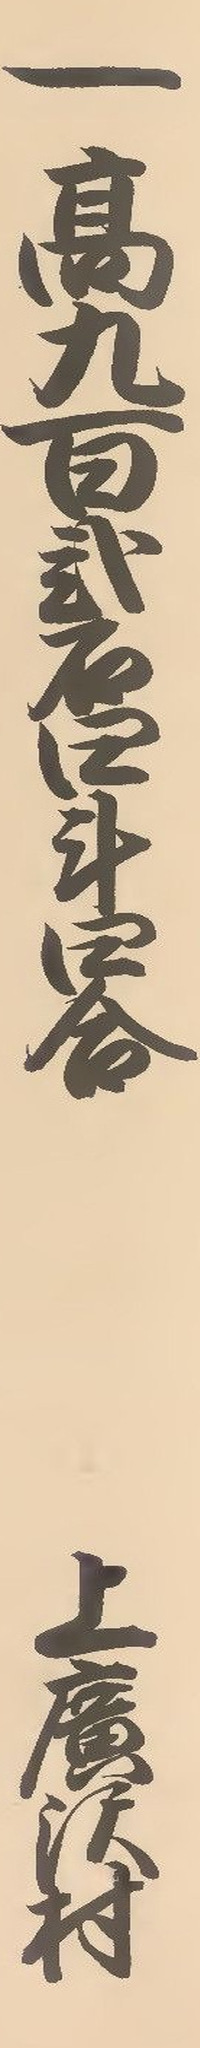一髙九百弐石四斗四合上廣沢村
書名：上野国郷帳
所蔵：国立公文書館 National Archives of Japan
